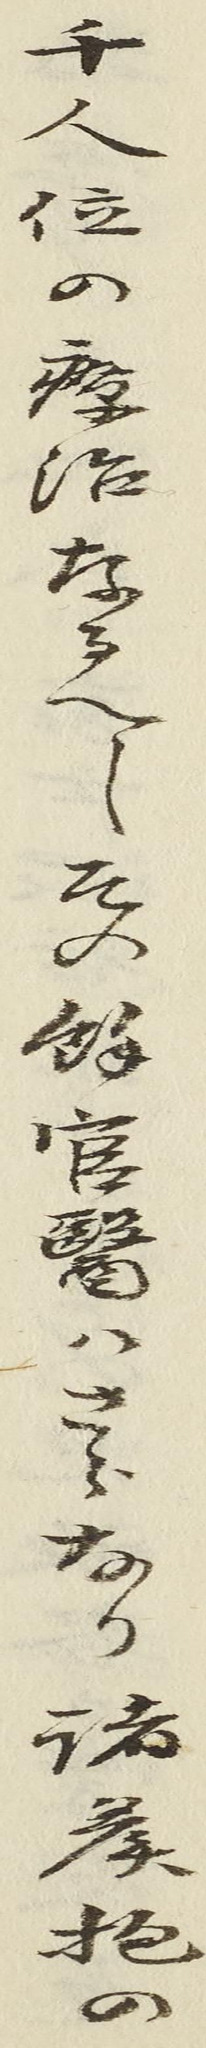千人位の療治なるへしその餘官医ハさらなり諸侯抱の
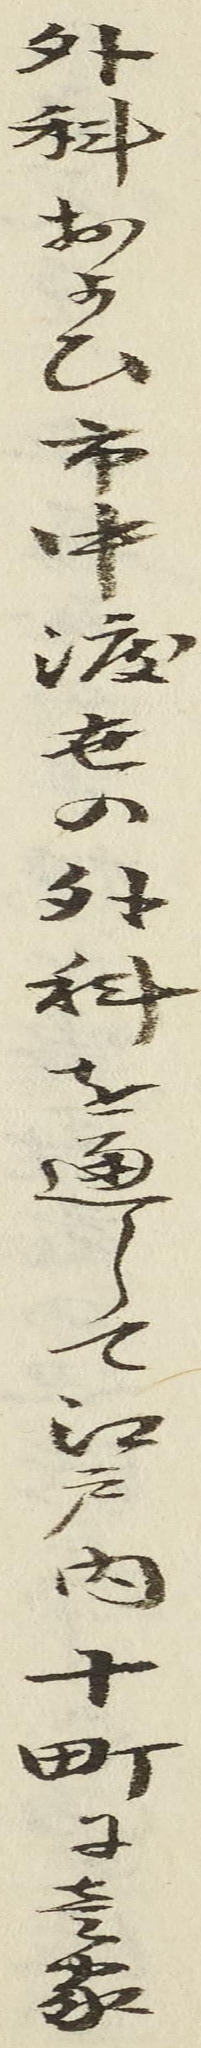外科およひ市中渡世の外科を通して江戸内十町に壱家
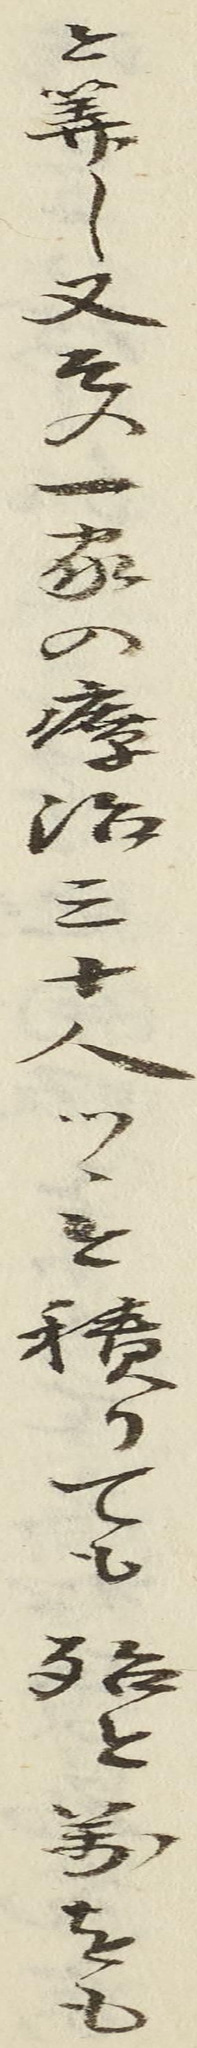と算し又その一家の療治三十人つゝを積りても殆と萬をも
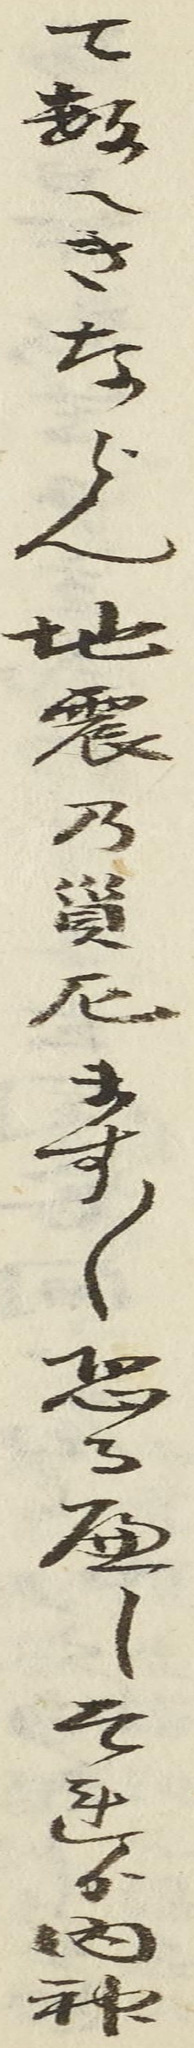て数へきならん地震の災厄ます〳〵恐るへしそれゟ内神
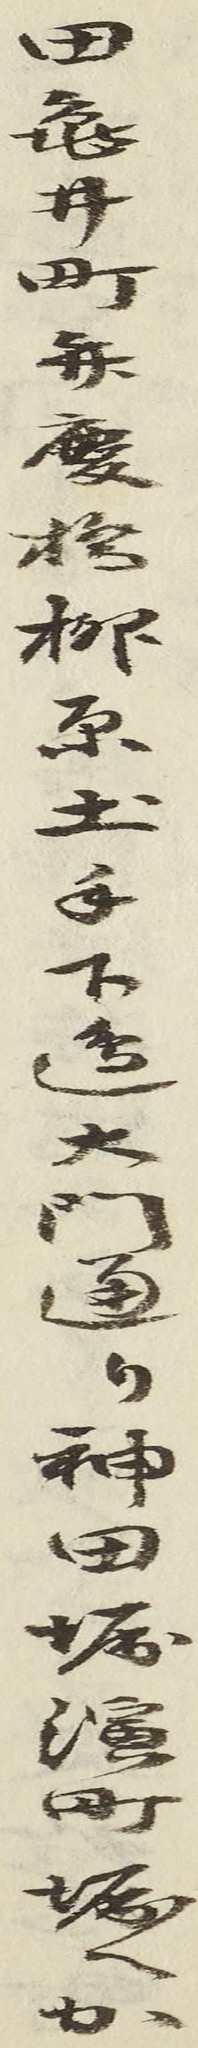田亀井町弁慶橋柳原土手下過大門通り神田堀浜町堀へか
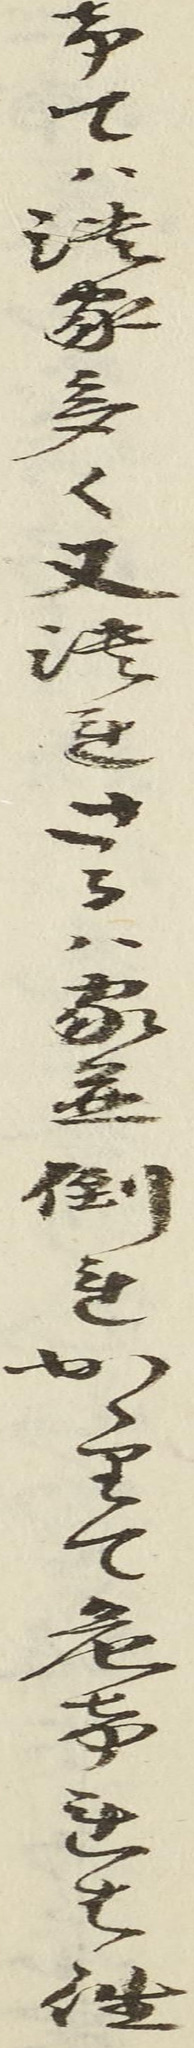けてハ潰家多く又潰れさるハ家並倒れかゝりて危けれは往
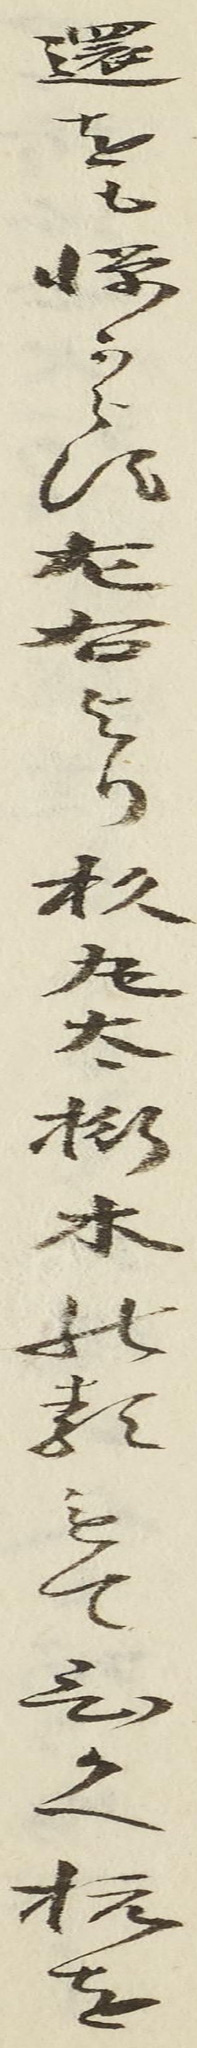還をも憚らす左右より杉丸太桁木の類もてひかへ杭を
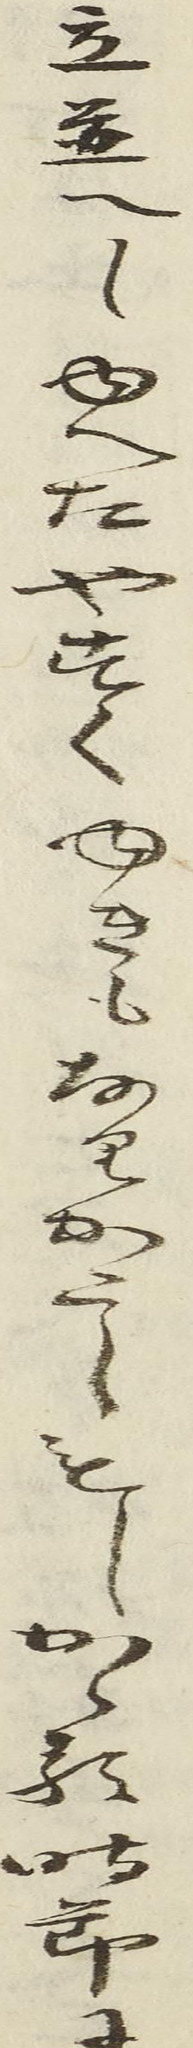立並へしゆへたやすくゆきもなりかたしもしかゝる時節に
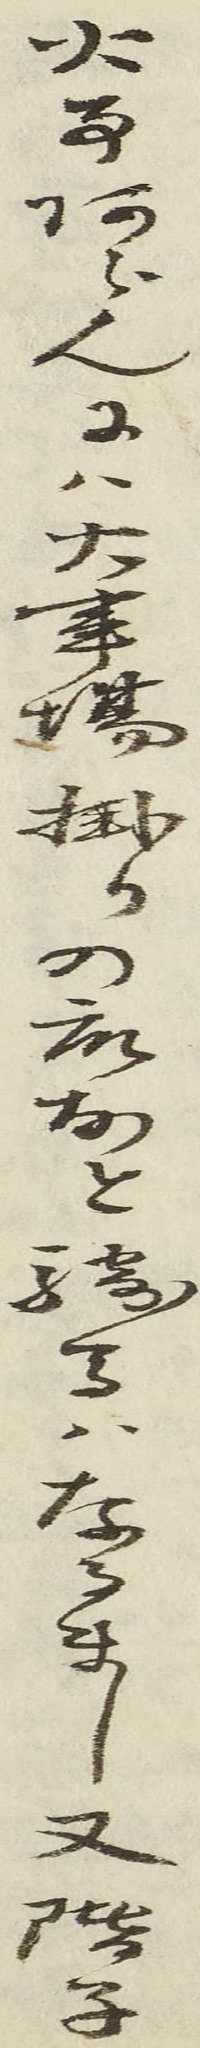火事あらんにハ火事場掛りの衆なと騎馬ハなるまし又階子
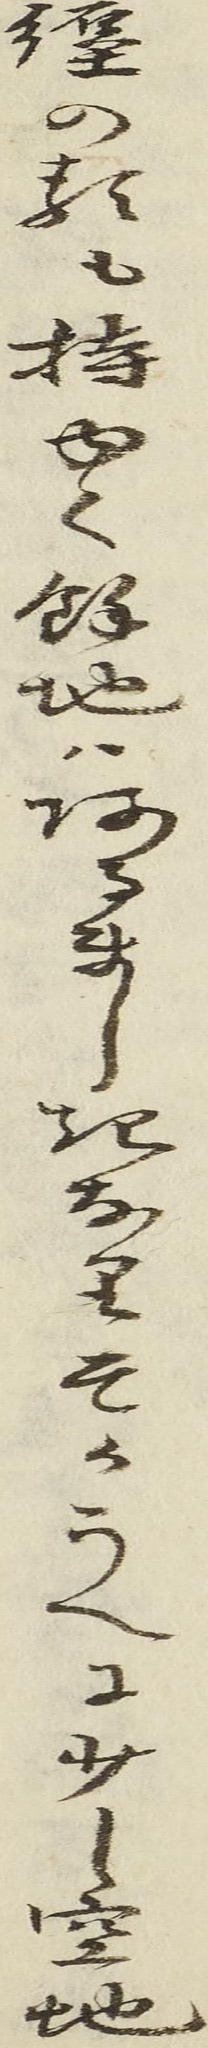纏の類も持ゆく余地ハあるましきなりそかうへに少し空地

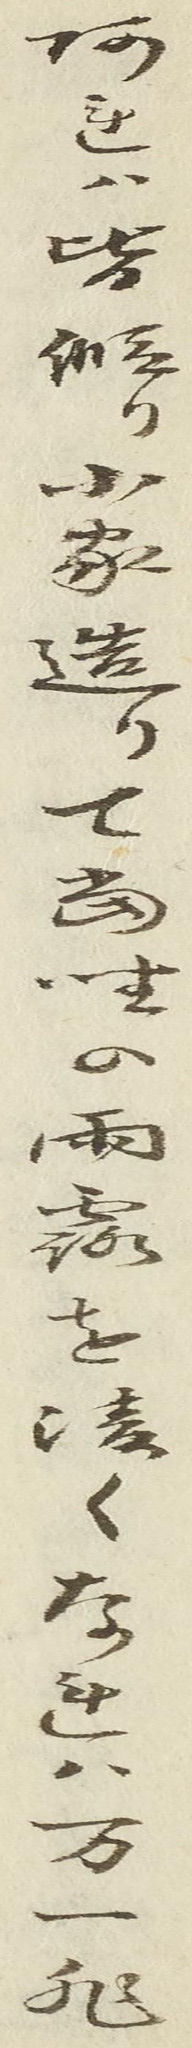あれハ皆修り小家造りて当座の雨露を凌くなれハ万一非
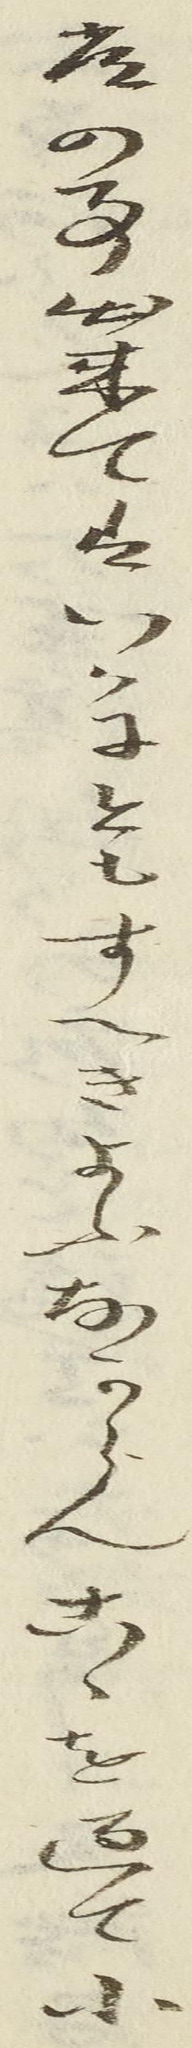常の事出来てはいかにともすへきよふなからんこゝを過て小
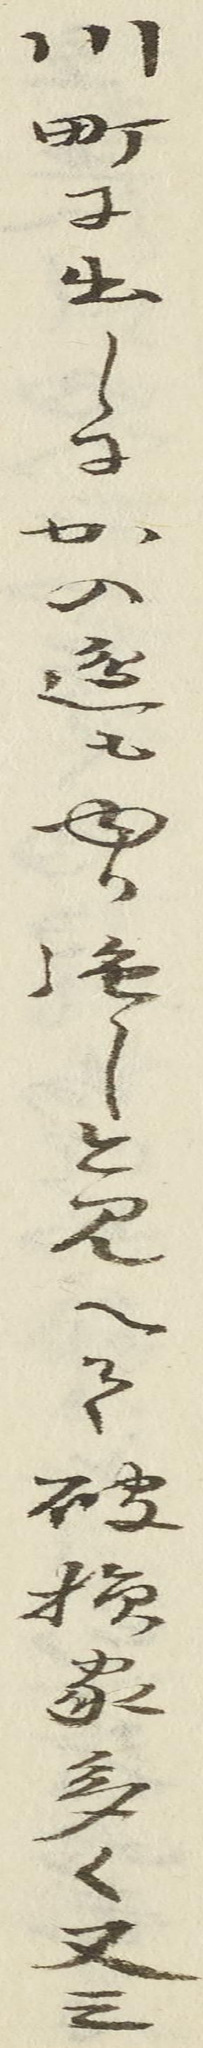川町に出しにかの辺もゆり潰しと見へて破損家多く又三
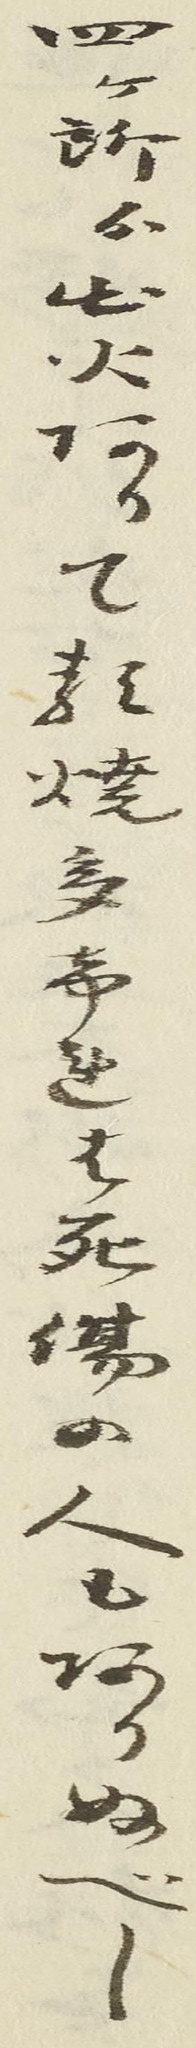四ヶ所ゟ出火ありて類焼多けれは死傷の人もありぬへし
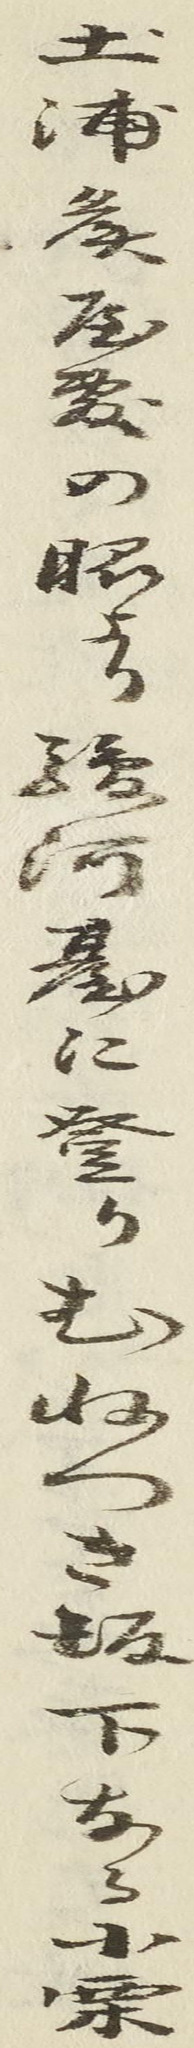土浦矦屋敷の脇より駿河台に登りむねつき坂下なる小栗
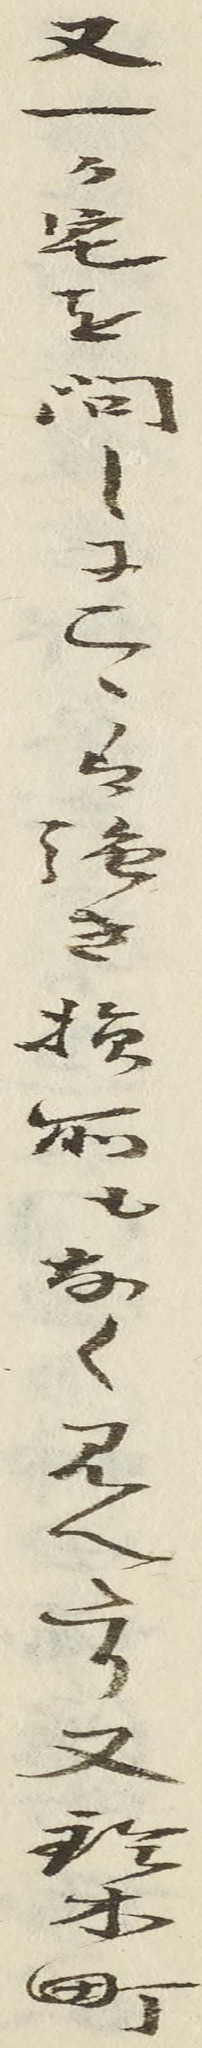又一か宅を問しにこゝは強き損所もなく見へたり又鈴木町
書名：那為の後見艸　全
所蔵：東京大学地震研究所図書室 Earthquake Research Institute Library, The University of Tokyo, JAPAN
